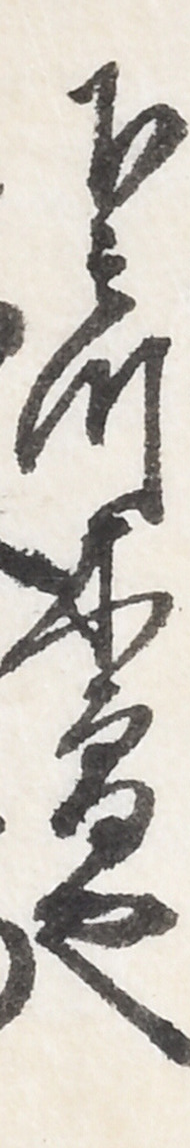下モ町木曽や
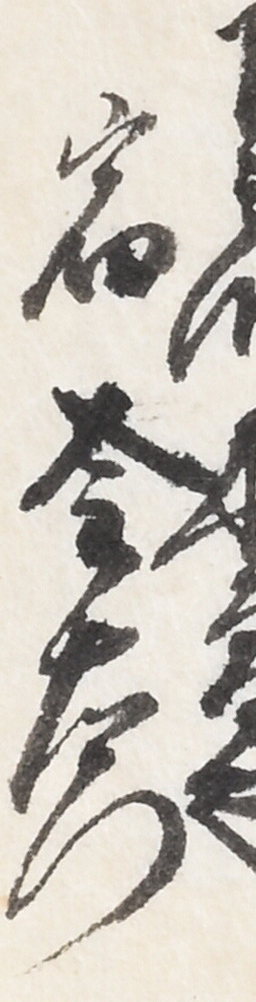宿金右衛門
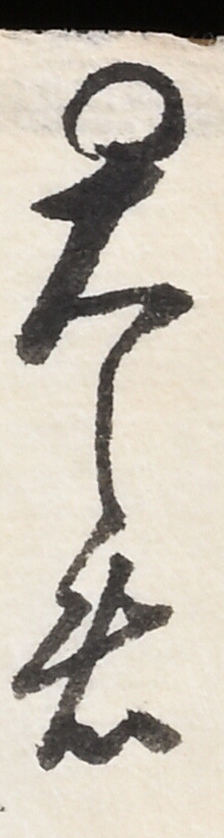〇右之者
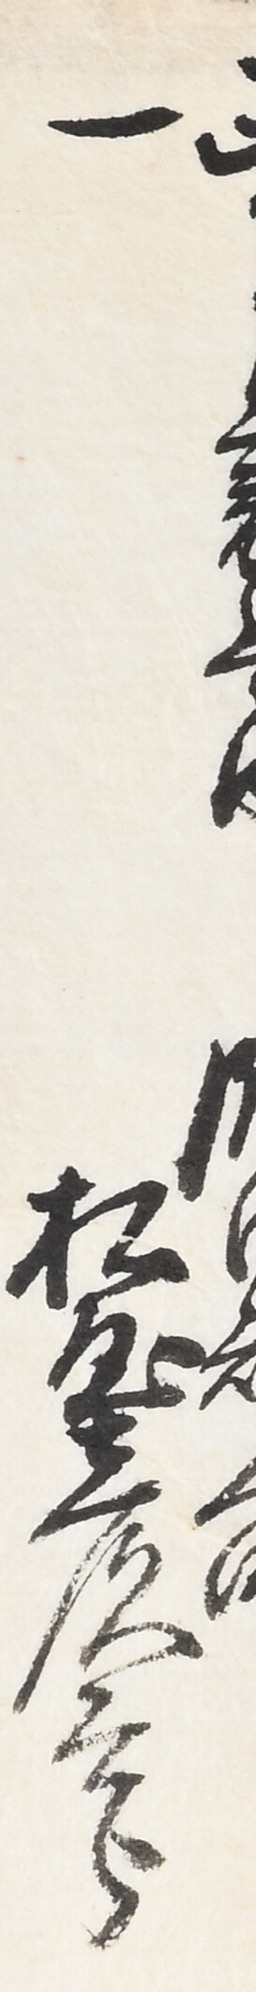一松屋彦太郎
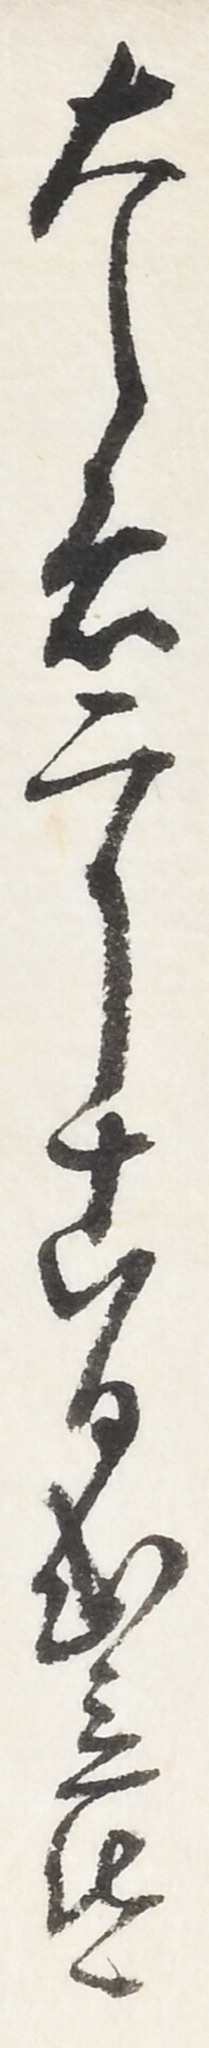右之者二月十八日出立仕候
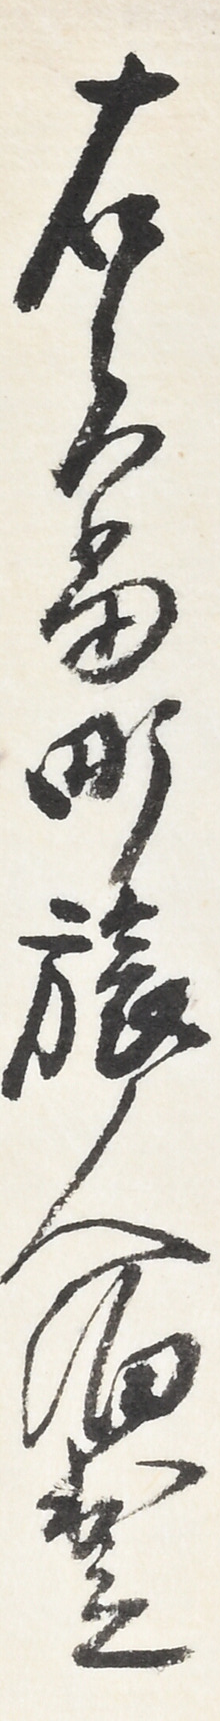右者当町旅人泊出立
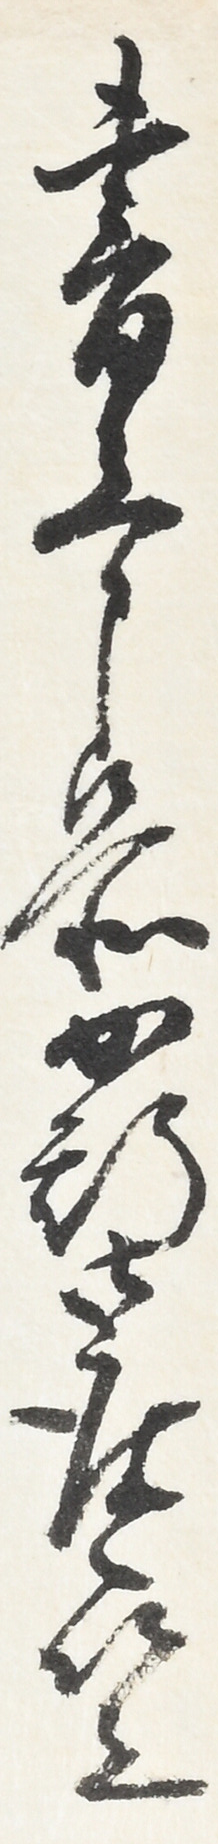書上申候所如斯御座候以上
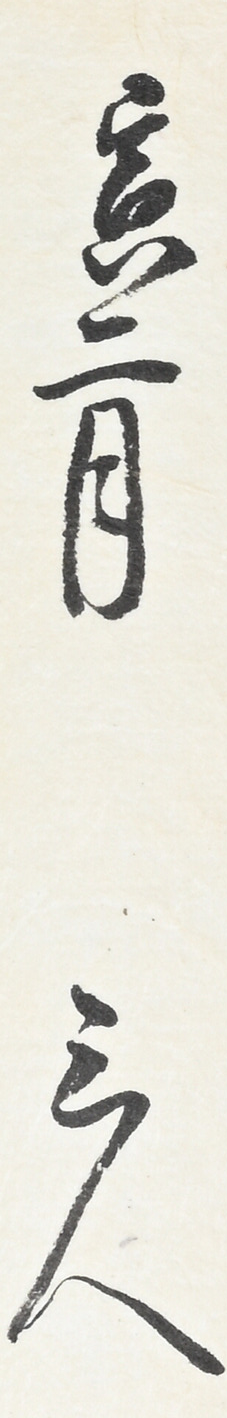寅二月三人
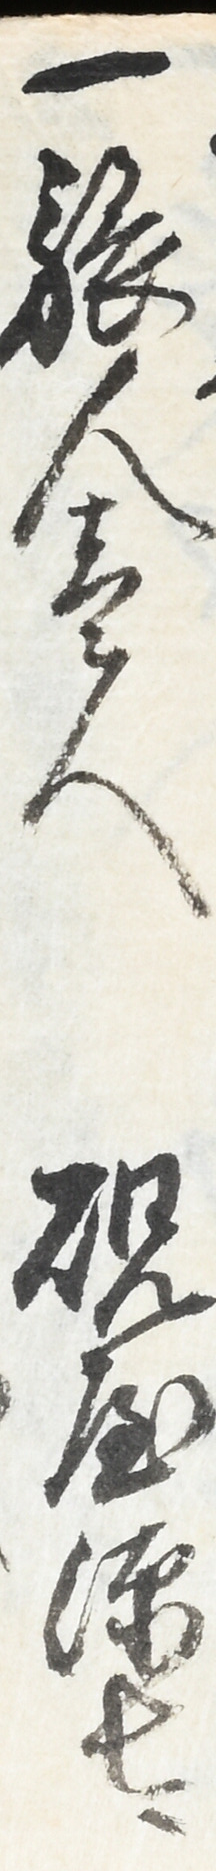一旅人壱人墨屋善兵衛
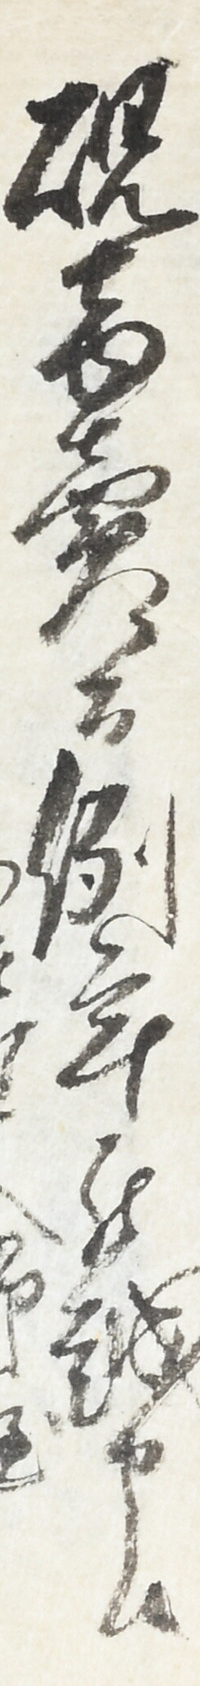小間物商売ニ而例年罷越申候

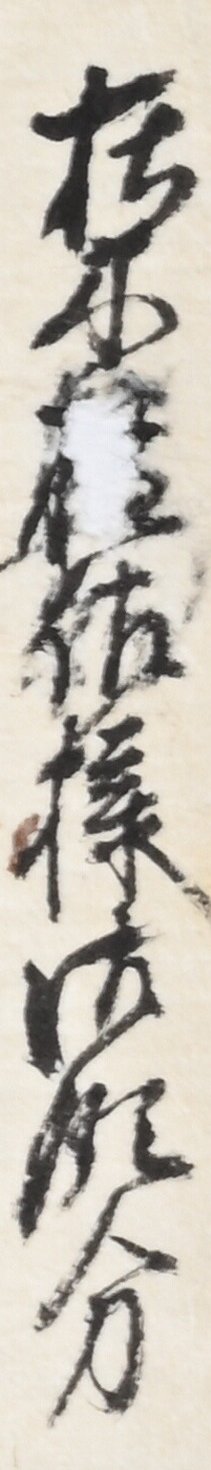朽木権佐様御領分
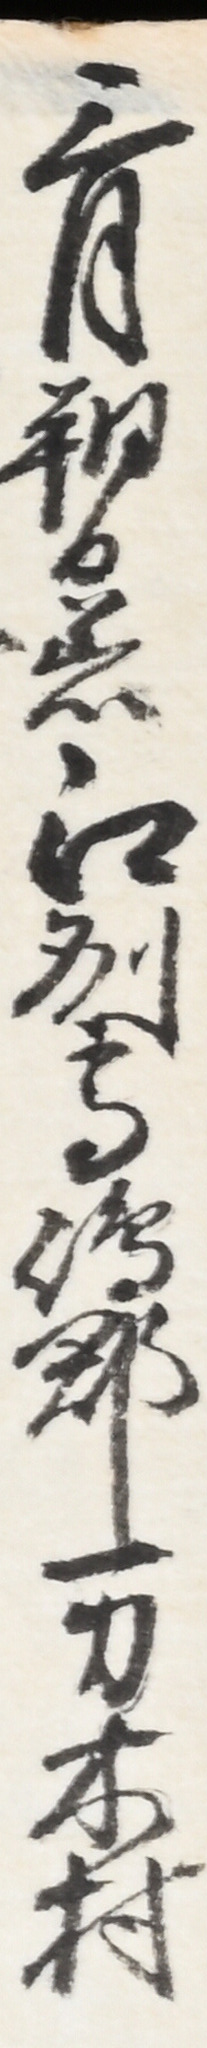三月朔日着江州高嶋郡万木村
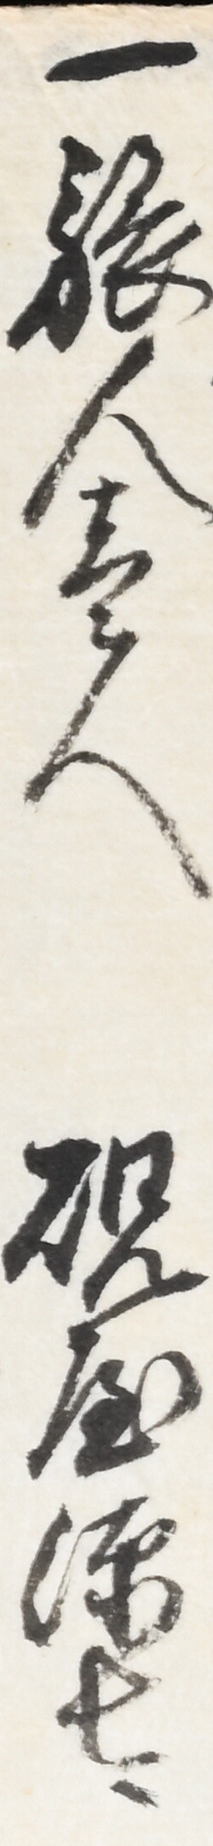一旅人壱人硯屋源七・
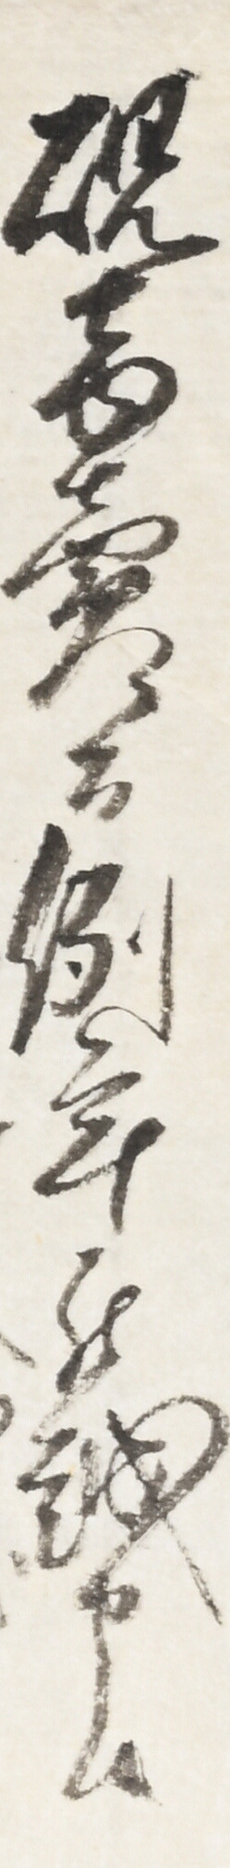硯商売ニ而例年罷越申候
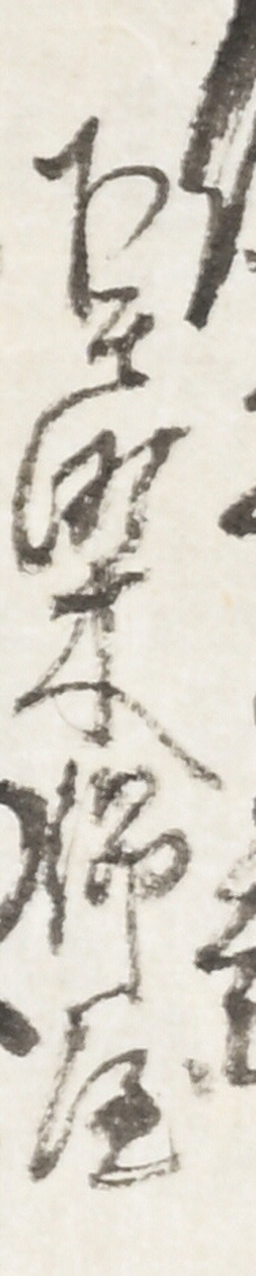下モ町木綿屋
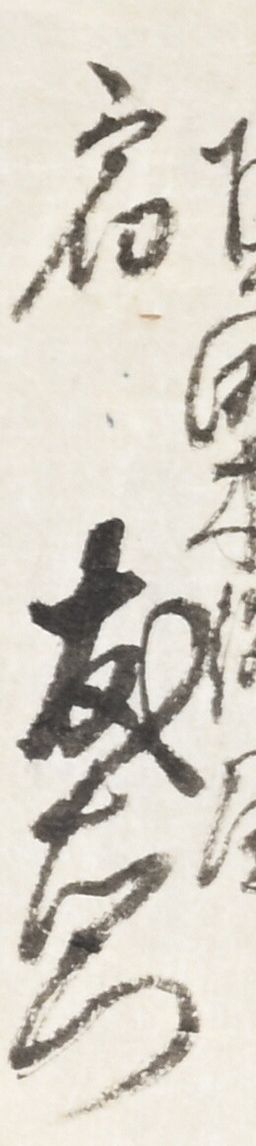宿友右衛門
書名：旅人泊控帳
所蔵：伊那市立高遠町図書館・合同会社AMANE
